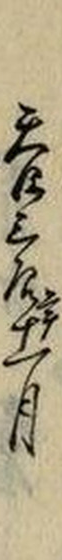天保三辰年十一月
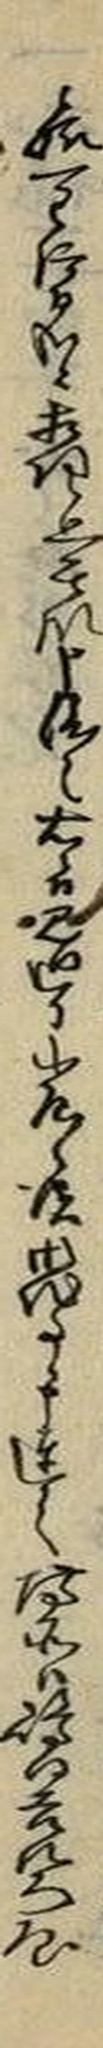候様可被仰付哉に相伺候上其段申渡之右に付見廻り小屋之儀は御作事へ申達之場所は島田吉左衛門屋
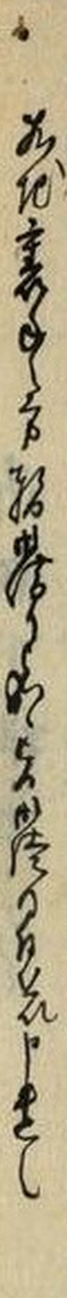敷地裏手之方暫御借り被成候旨御徒目付を以申遣之
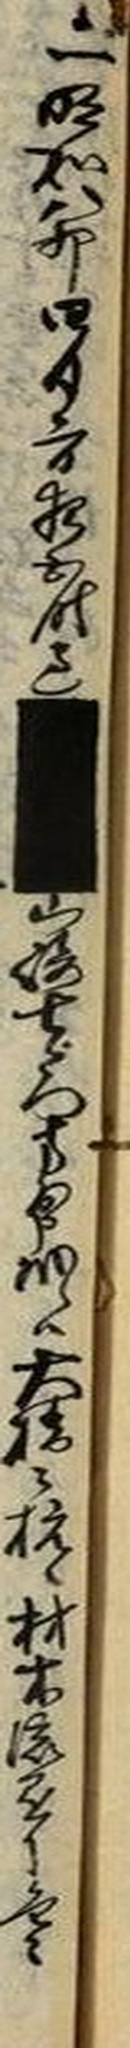一明和八卯四月二日夜五時過山崎七郎右衛門方ゟ申越候は大橋之杭へ材木流懸り色々
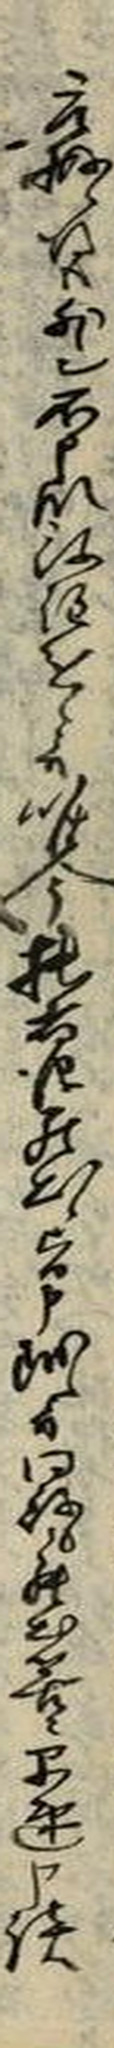取扱候得共外レ不申段致注進候に付唯今拙者儀罷出候旨申越候に付同役も罷出筈に早速申談
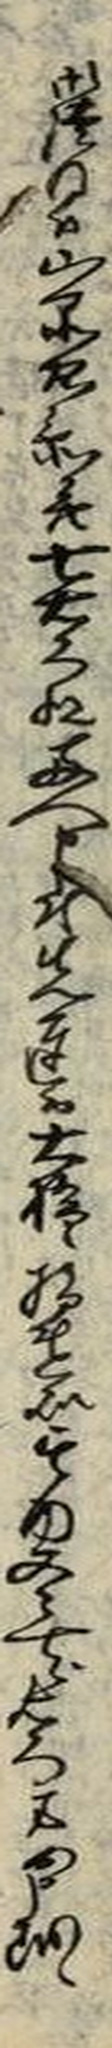御徒目付山品忠兵衛并七右衛門組両人申付先達て大橋へ指遣処其内又々七郎右衛門方ゟ申越候
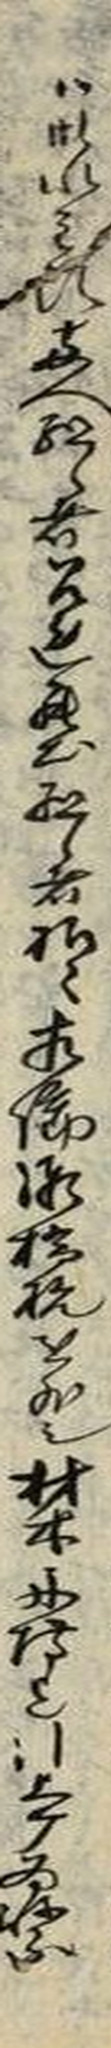は御水主頭両人組之者召連罷出組之者様々相働漸橋杭を外シ材木舟場迄引上ケ為繋
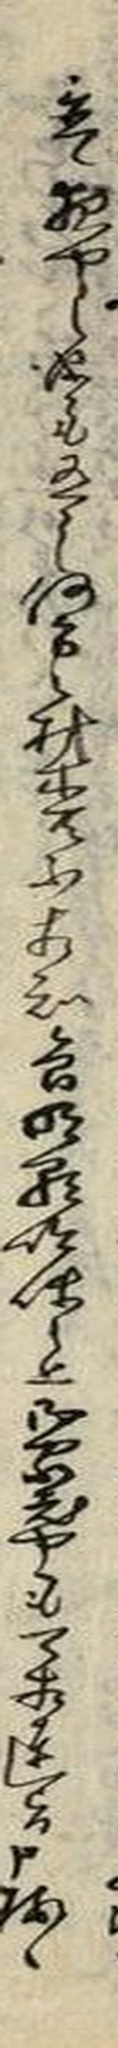置候夜中之儀にも有之何方之材木共不相知候間明朝吟味之上御家老中へも可相達旨申残候
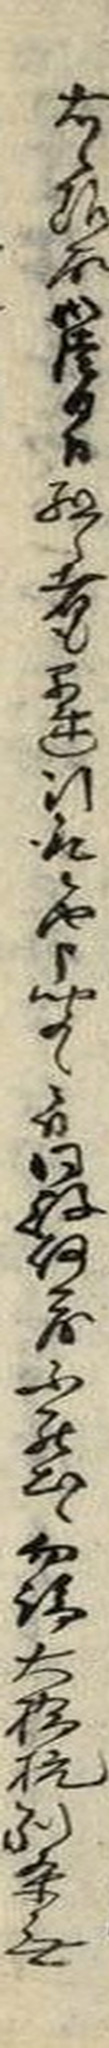右之趣故御徒目付組之者も早速引取候由申聞候に付同役何も不罷出候勿論大橋杭別条無
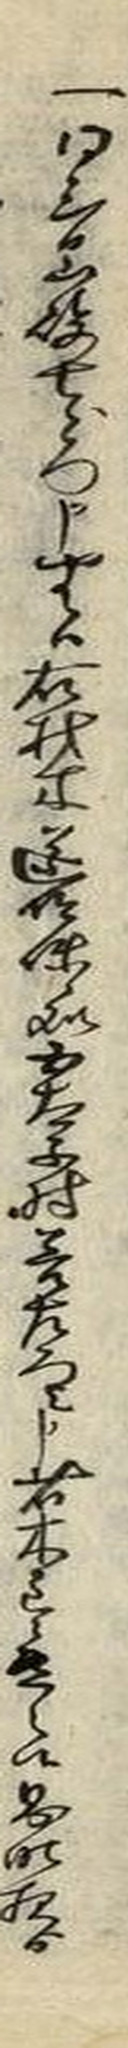一同三日山崎七郎右衛門申聞候は右材木遂吟味候処五太子村善左衛門と申者木主に有之候則昨夜ゟ
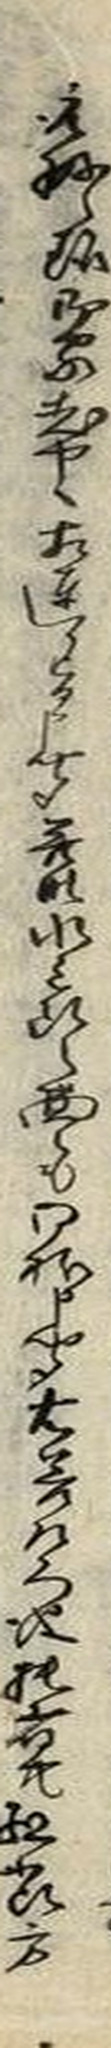取扱之趣御家老中へ相達候旨申聞并御水主頭之面々も同様申聞右善左衛門儀拙者共組小頭方
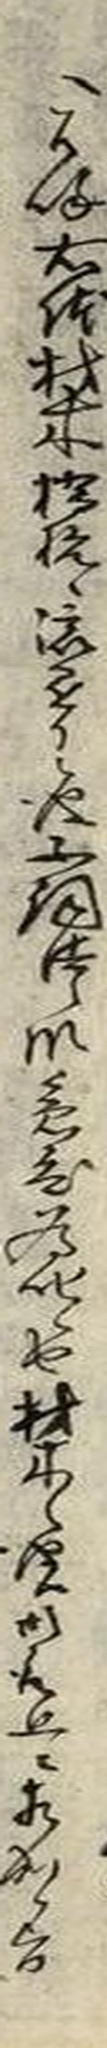へ召呼右体材木橋杭へ流懸り候儀不調法之段急度為叱候由材木之儀は御取上に相成候旨
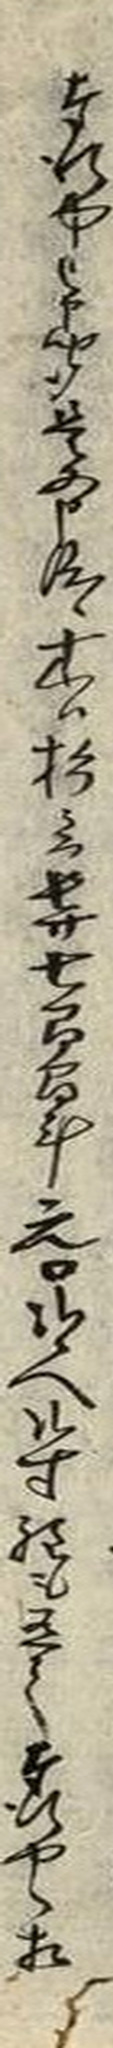奉行中被申聞是又申渡候木は杉にて長サ七間間斗元口弐尺弐寸程も有之奉行中へ相
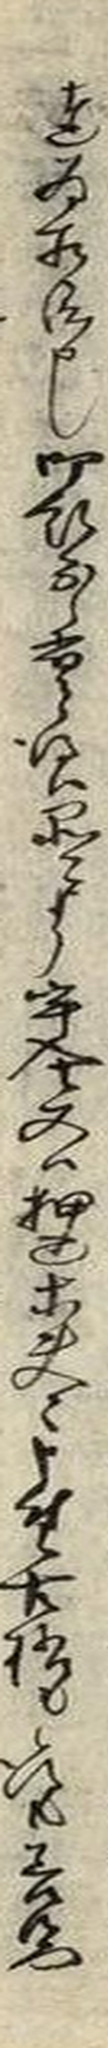達為相渡申候御領分之者に候得は品により牢舎又は押込等夫々申付候古格も候得共善左衛門
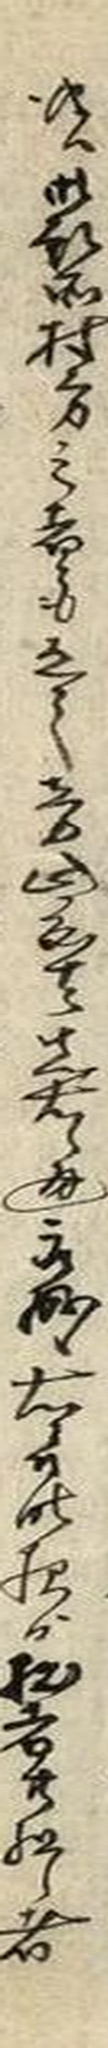儀は御預所村方之者にも有之旁此度は先右之通取扱候右に付昨夜ゟ拙者共組之者
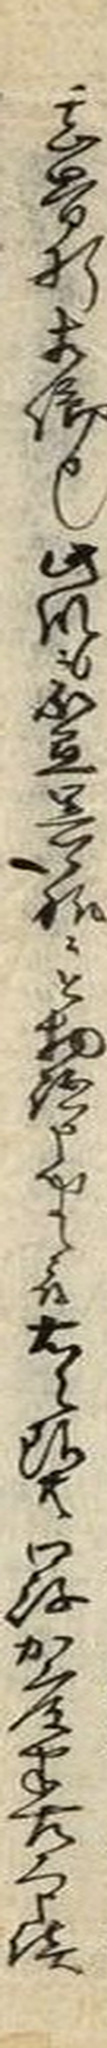甚骨折相働申候此段も承置呉候にと物語申聞候に付右之趣共同役加藤半左衛門申談
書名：御城下諸事之部
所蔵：福井県文書館 Fukui Prefectural Archives
